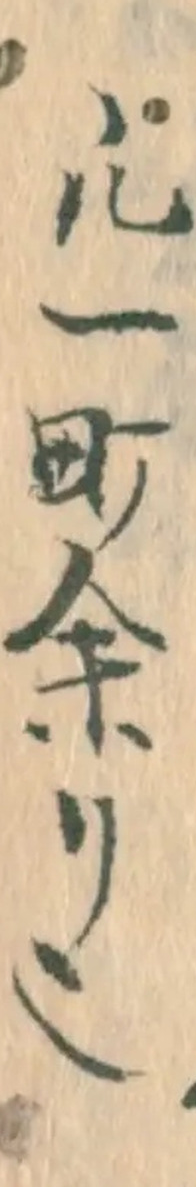凡一町余り也
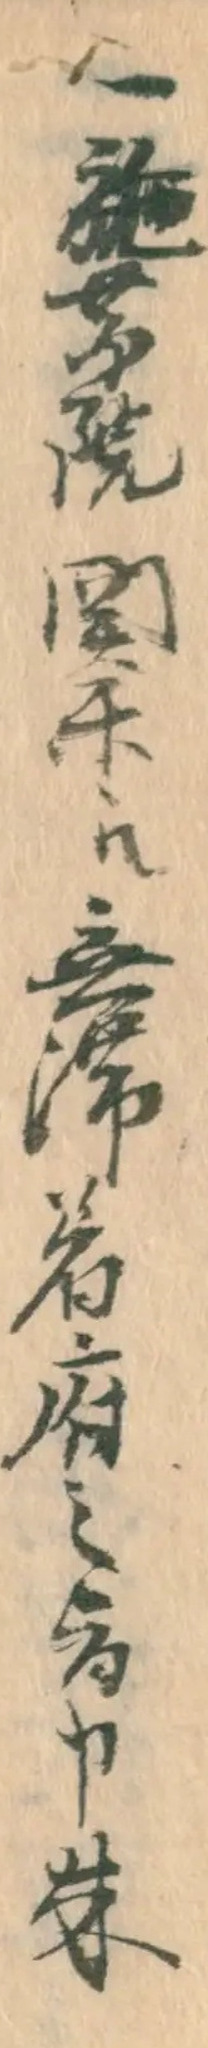一施薬院関東え無滞着府之旨申来
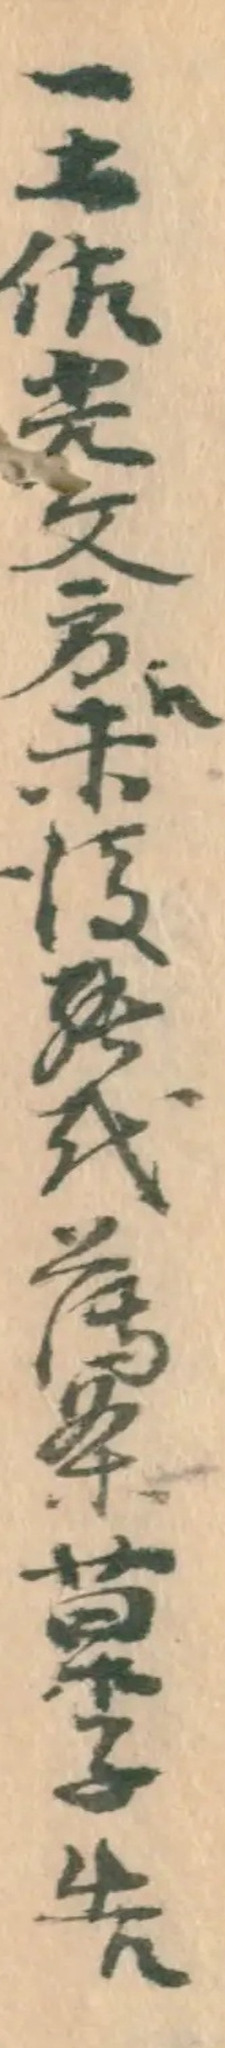一土佐光文方え未後罷越薄茶菓子出ル
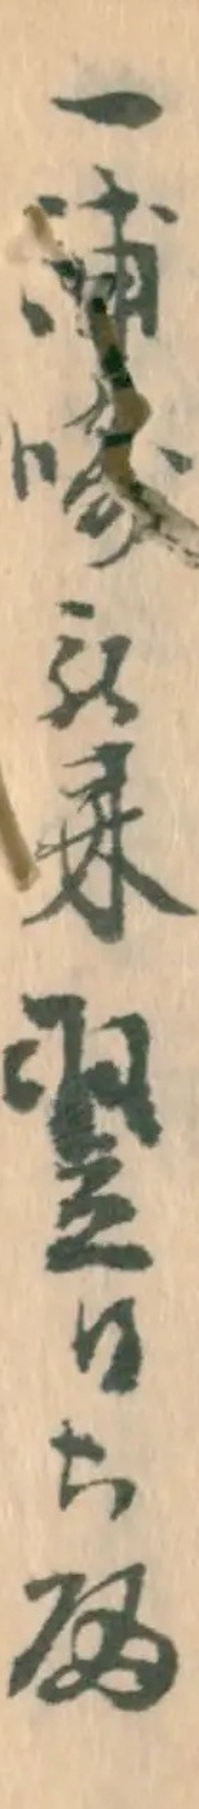一浦崎被来翌日被帰
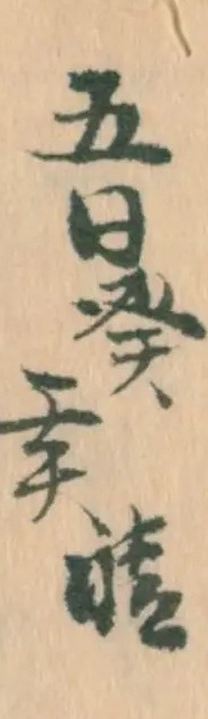五日癸亥晴
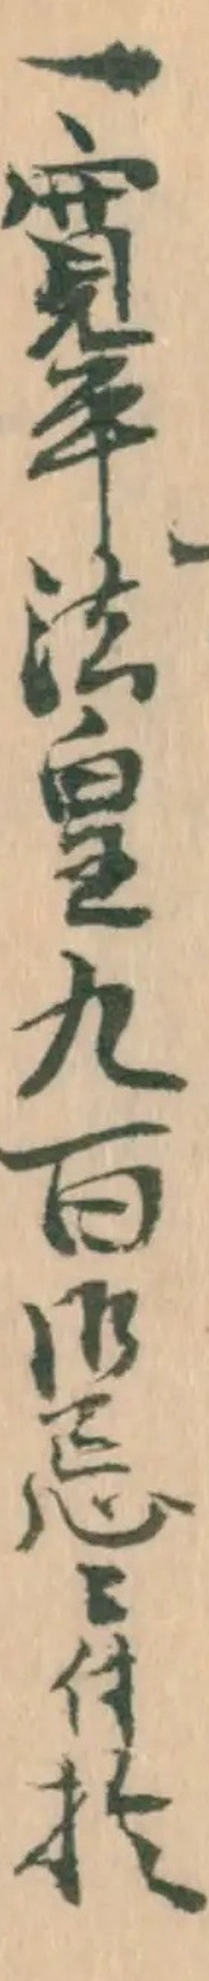一寛平法皇九百御忌ニ付於
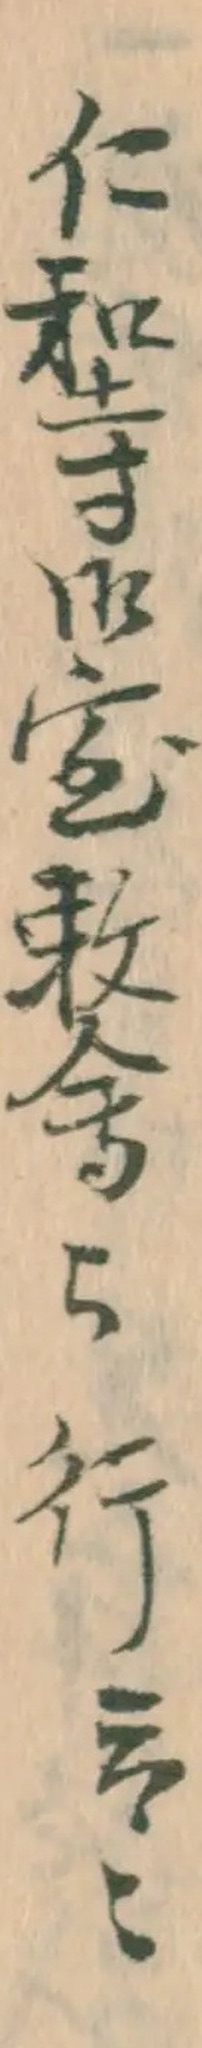仁和寺御室敕会被行云々
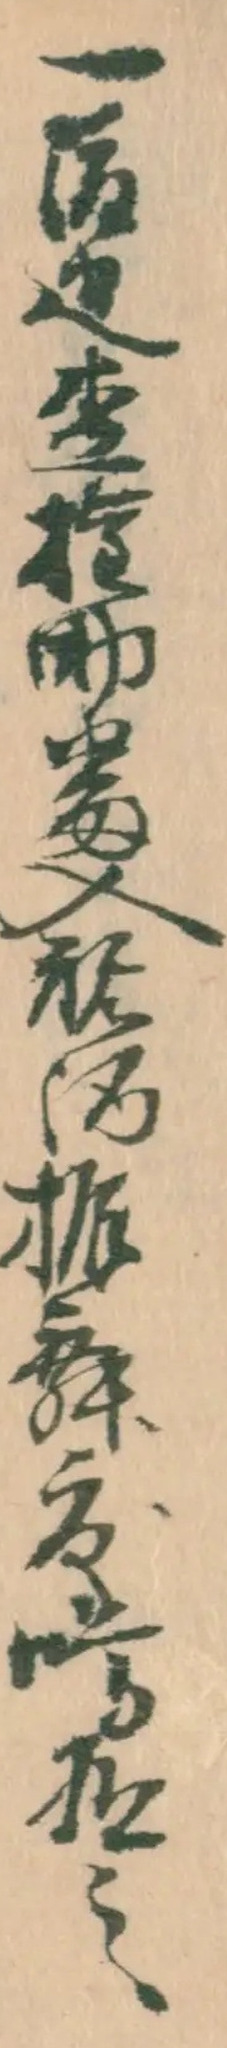一渡辺査権助番入祝酒振舞度噂有之
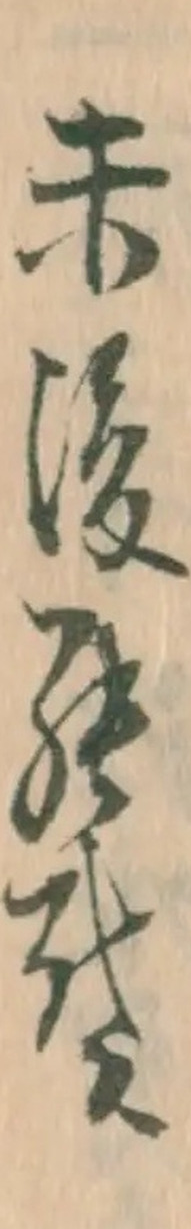未後罷越ス
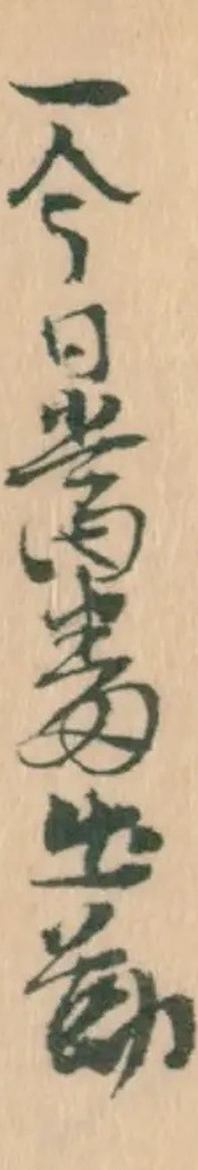一今日当番出勤
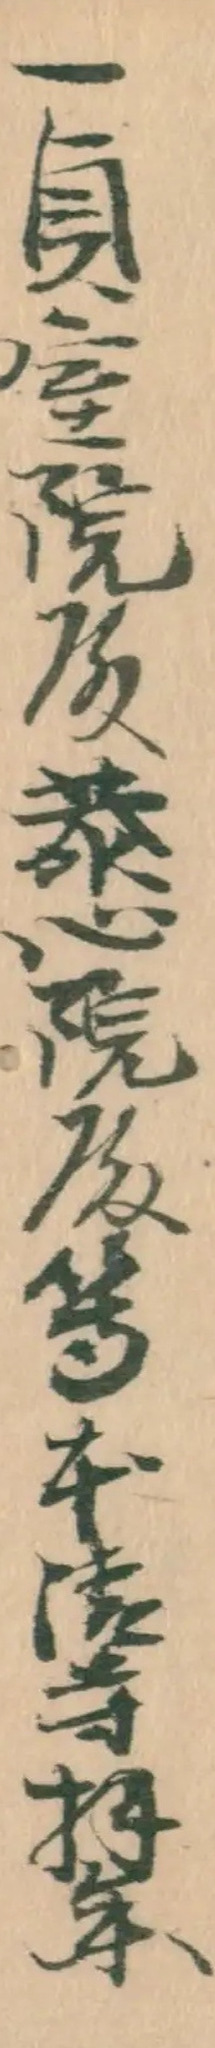一貞室院殿恭心院殿等本清寺拝参
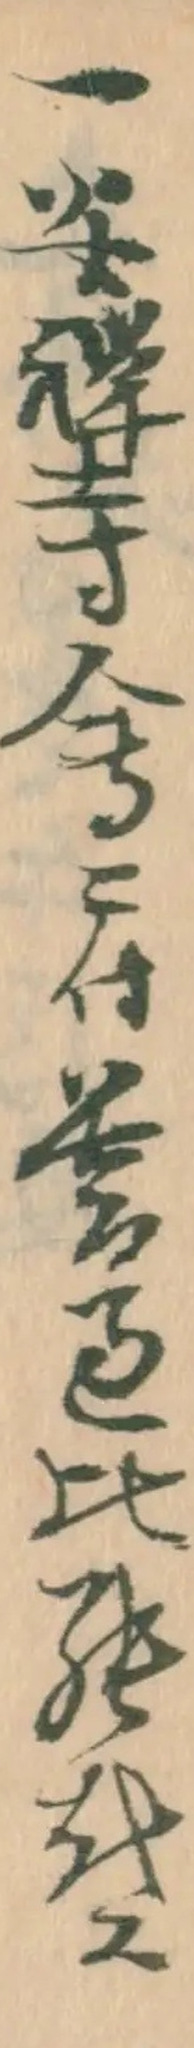一安禅寺会ニ付暮過頃罷越ス
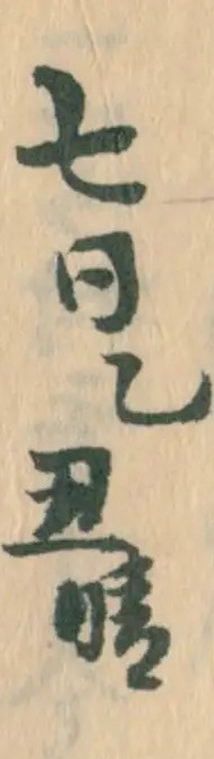七日乙丑晴
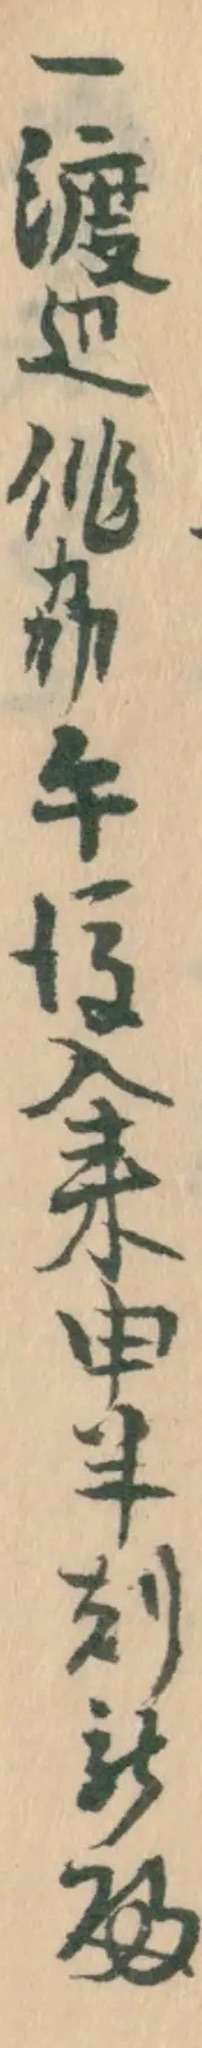一渡辺作州午後入来申半刻被帰

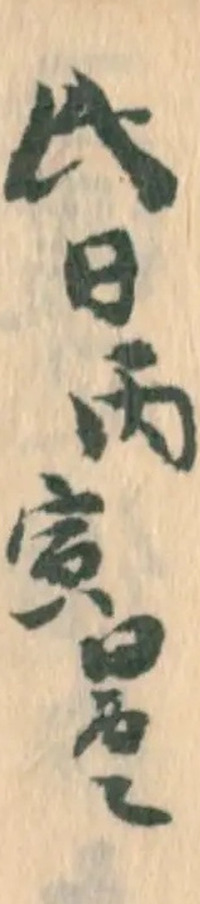八日丙寅曇
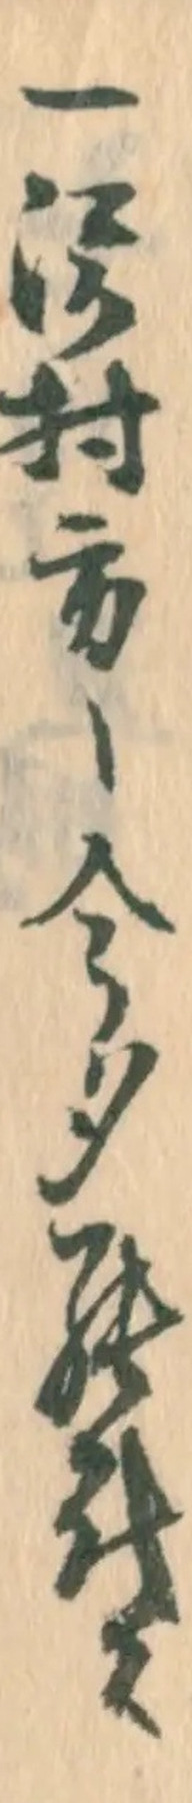一沢村方へ今夕罷越ス
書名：禁裏御所御用日記. [131]
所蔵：国立国会図書館 National Diet Library, JAPAN
